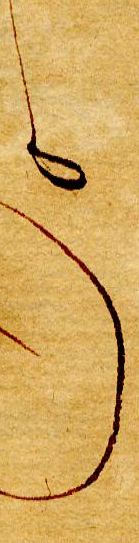To
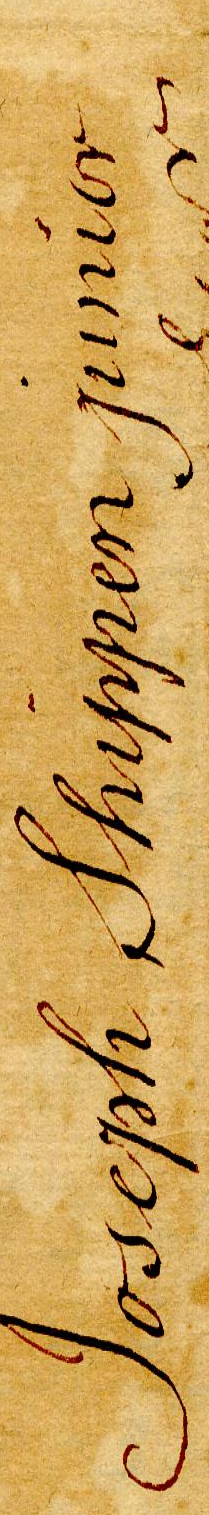Joseph Shippen junior
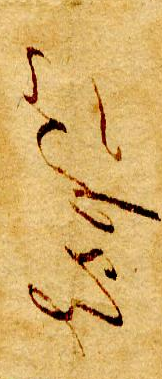Esq^r
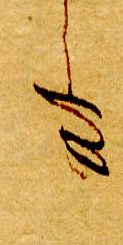at
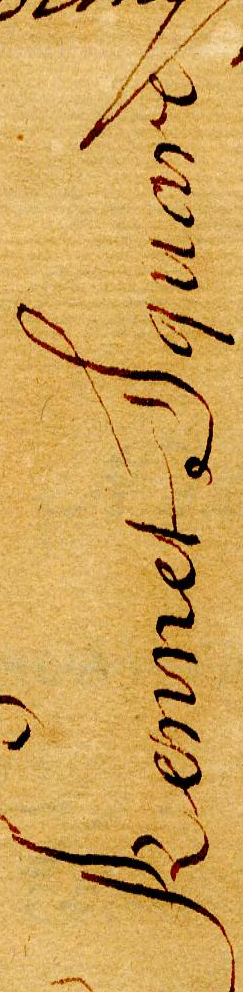Kennet Square
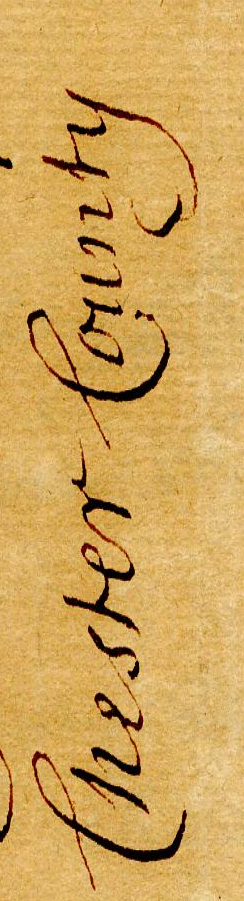Chester County
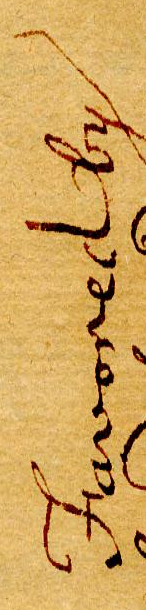Favoured by
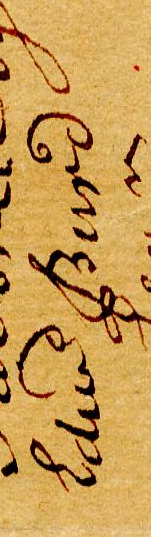Edw Burd
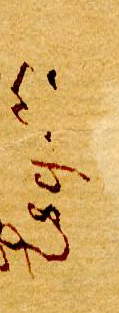Esq.^r.
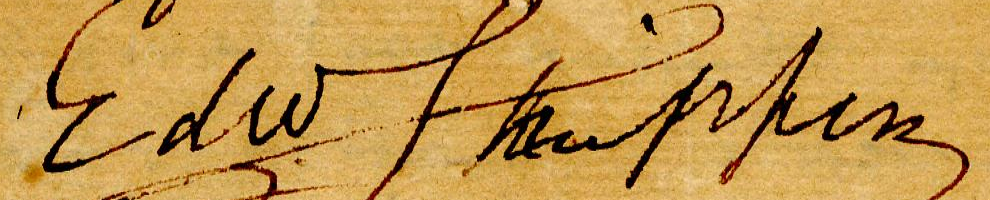Edw Shippen
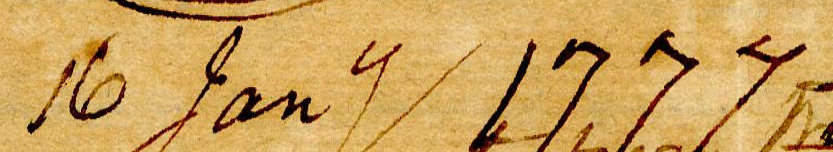16 Jan^y 1777
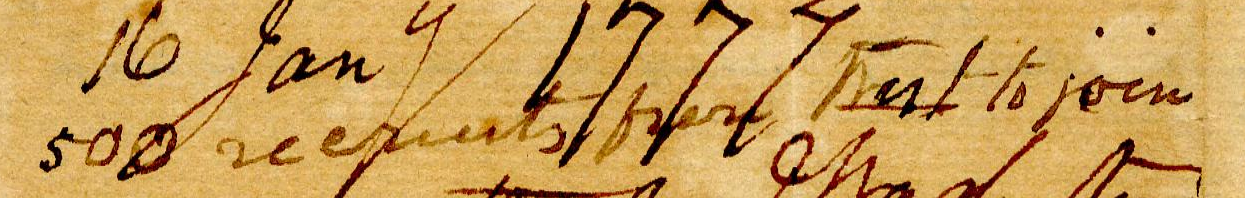500 receipts from West to join
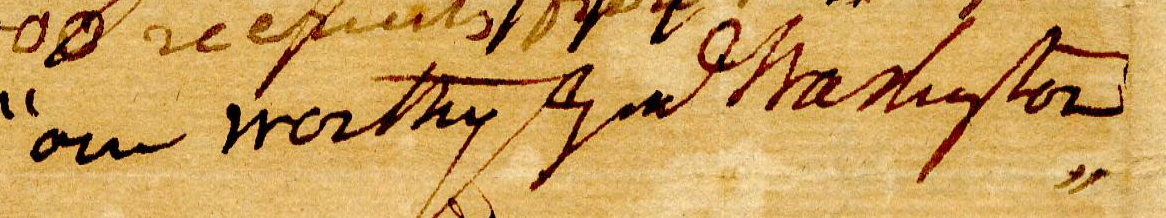"our worthy Gen^l Washington
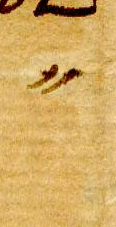"
